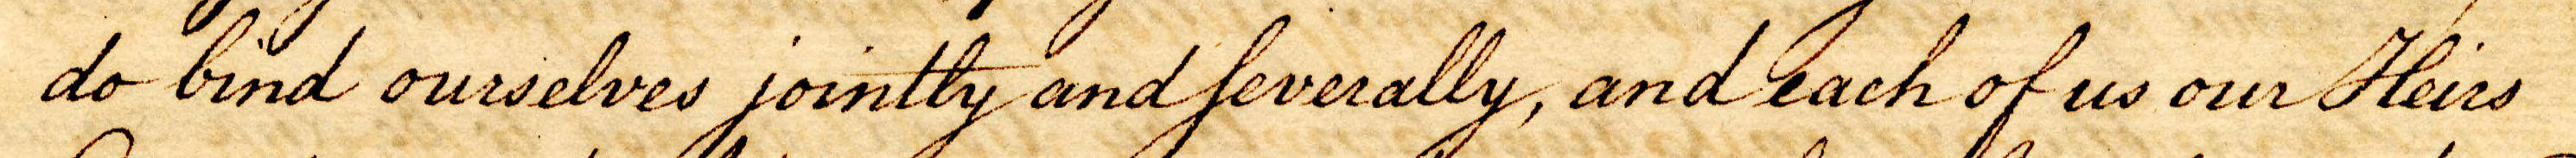do bind ourselves jointly and severally, and each of us our Heirs
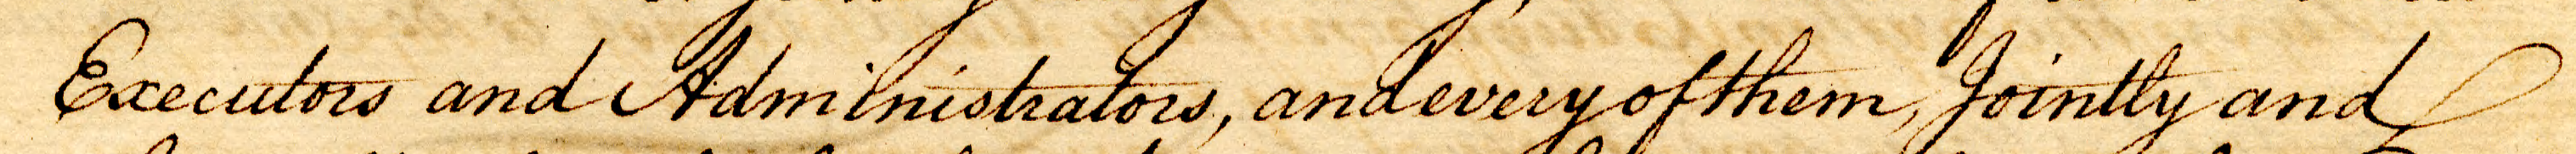Executors and Administrators, and every of them, jointly and
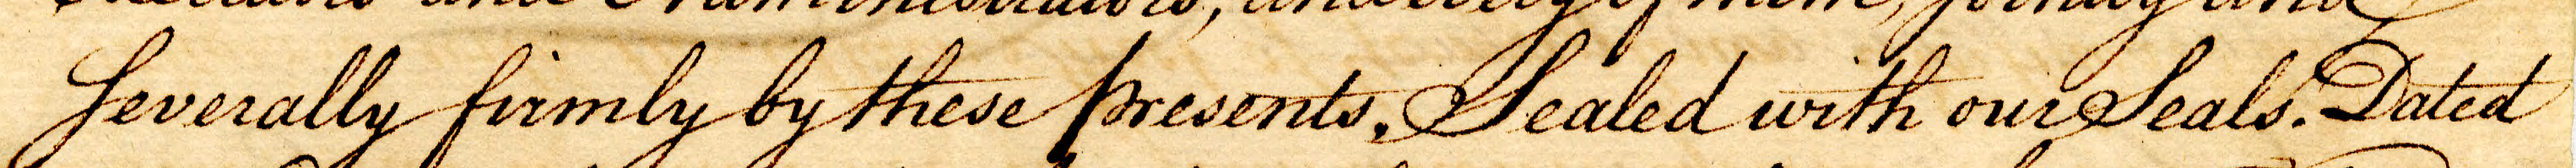Severally firmly by these presents, Sealed with our Seals. Dated
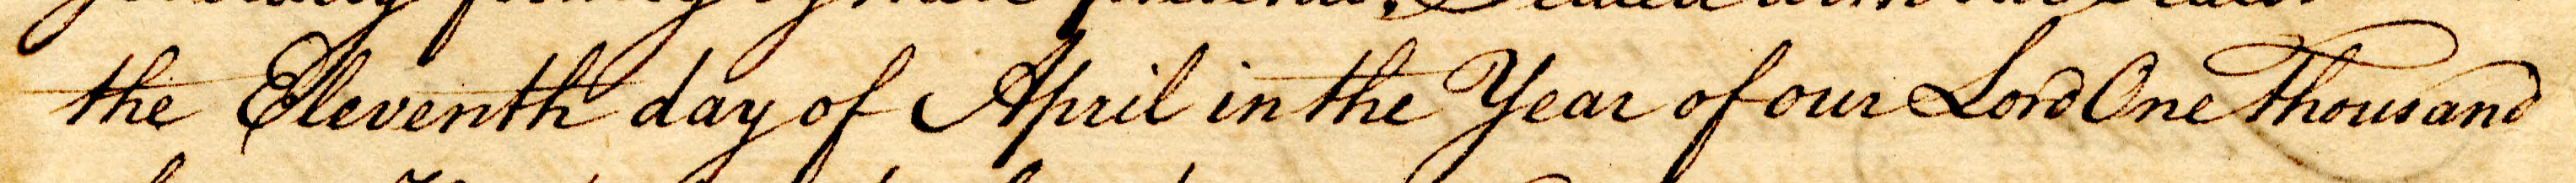the Eleventh day of April in the Year of our Lord One Thousand
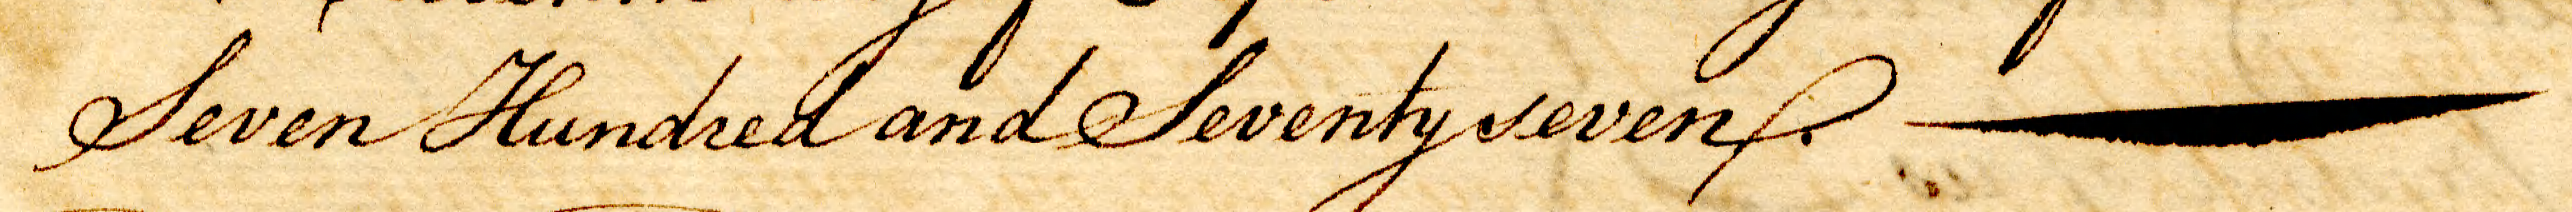Seven Hundred and Seventy seven.-
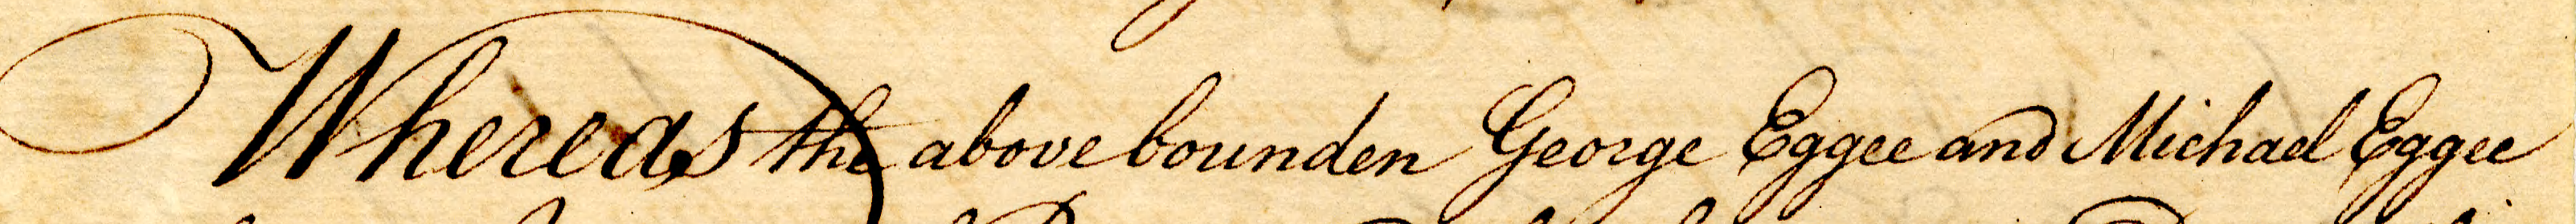Whereas the above bounden George Eggee and Michael Eggee
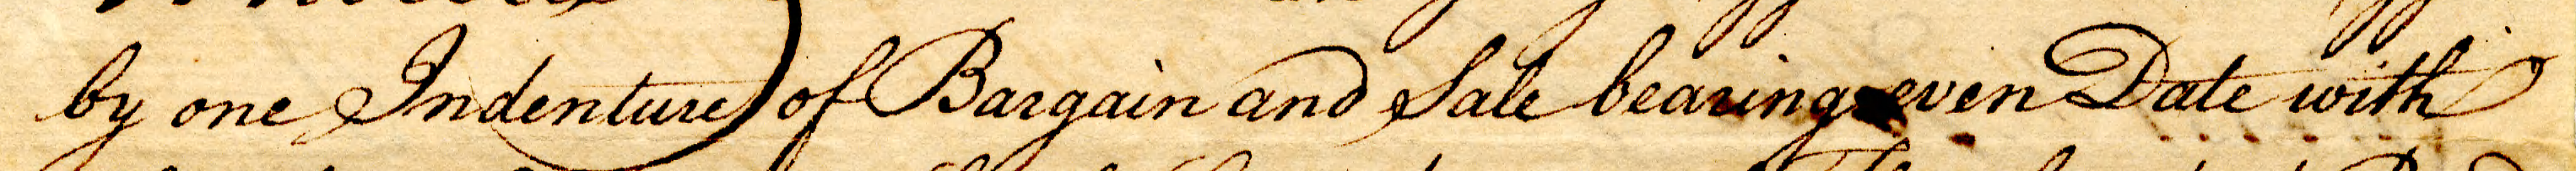by one Indenture of Bargain and sale bearing even Date with
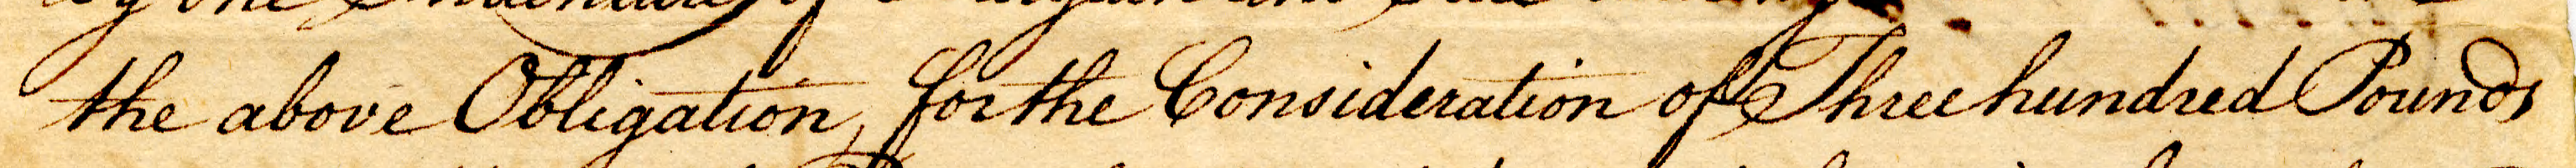the above Obligation, for the Consideration of Three hundred Pounds
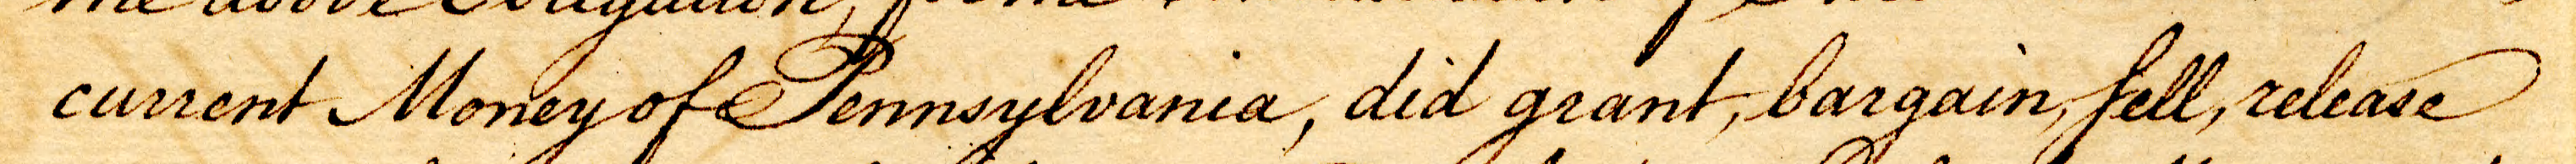current Money of Pennsylvania, did grant, bargain, sell, release
